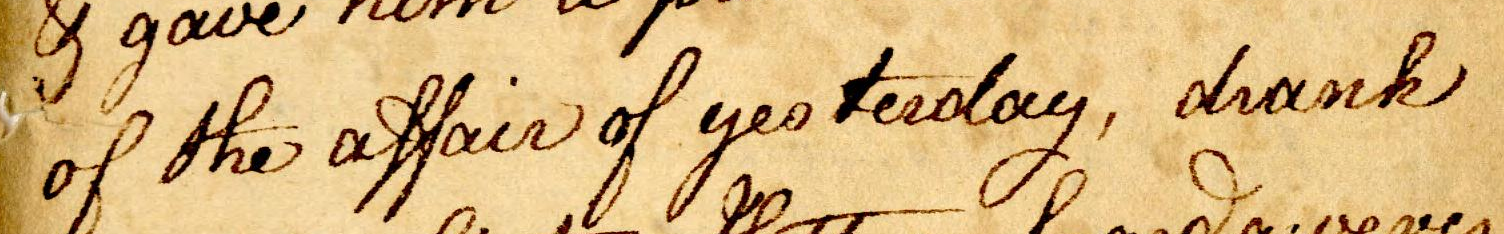of the affair of yesterday, drank
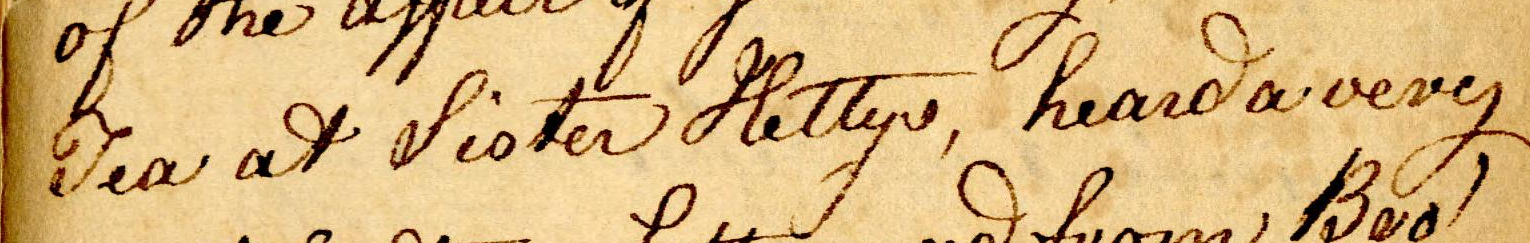Tea at Sister Hettys, heard a very
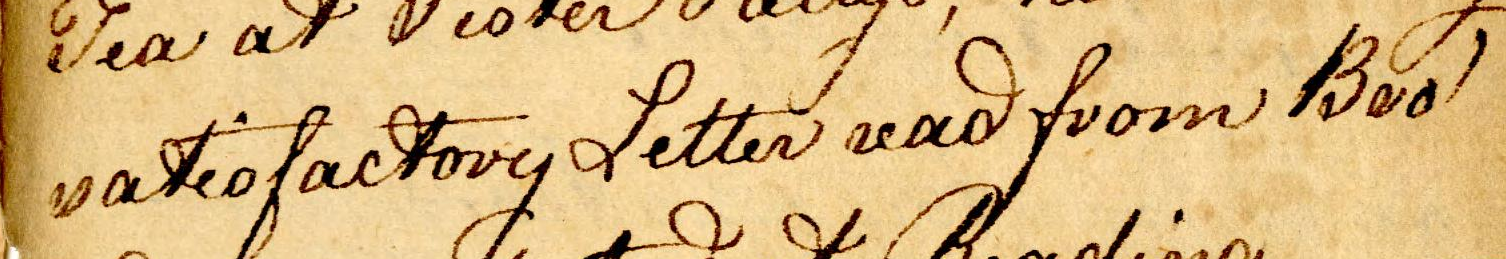satisfactory Letter read from Bro'
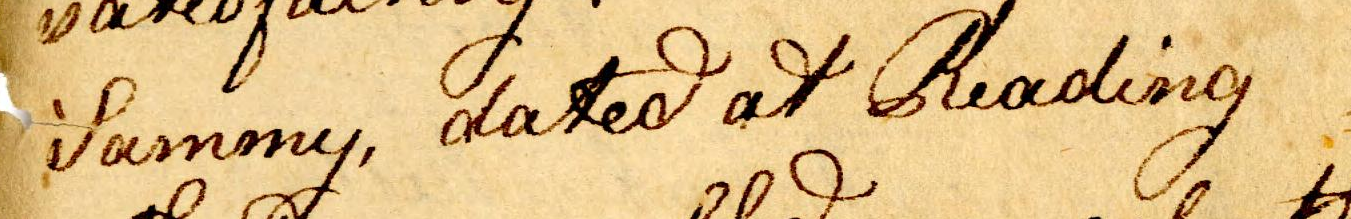Sammy, dated at Reading
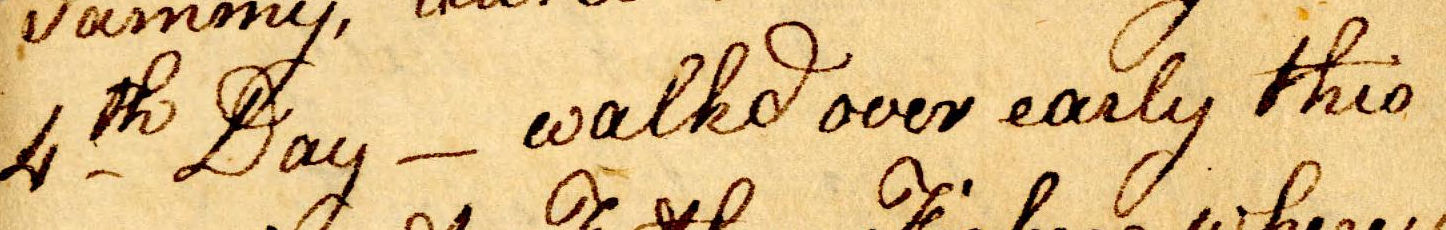4^th Day- walkd over early this
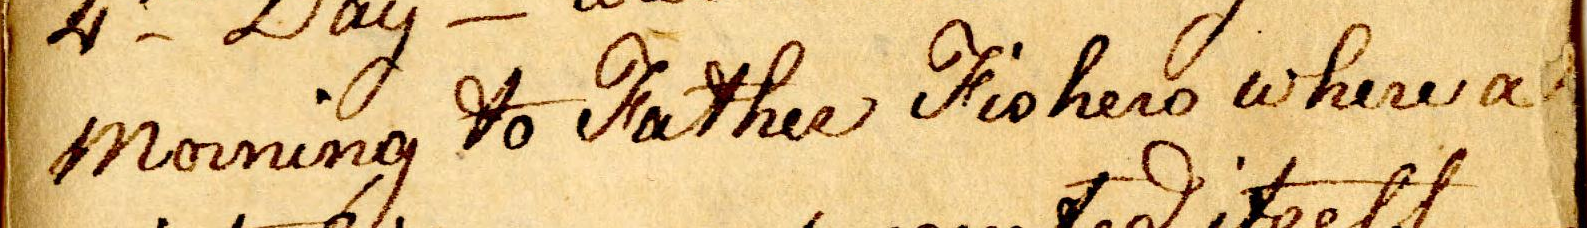Morning to Father Fisher where a
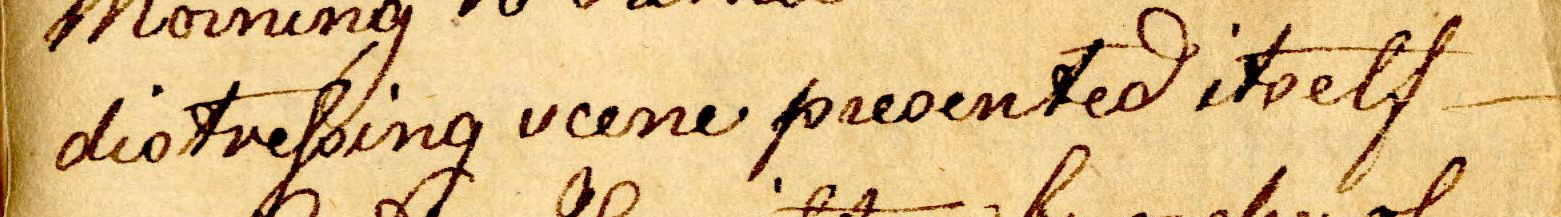distressing scene presented itself-
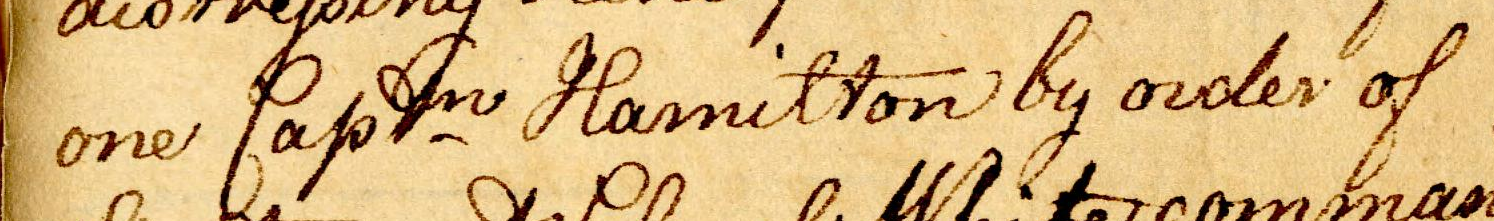one Capt^n Hamilton by order of
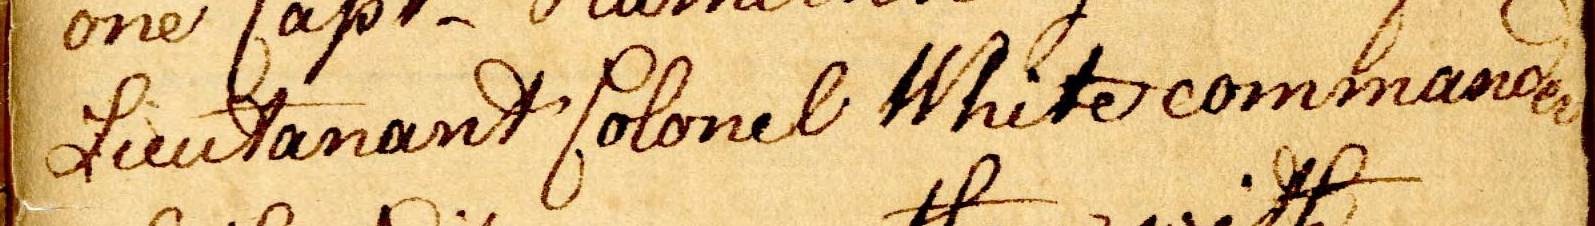Lieutanant Colonel White commander
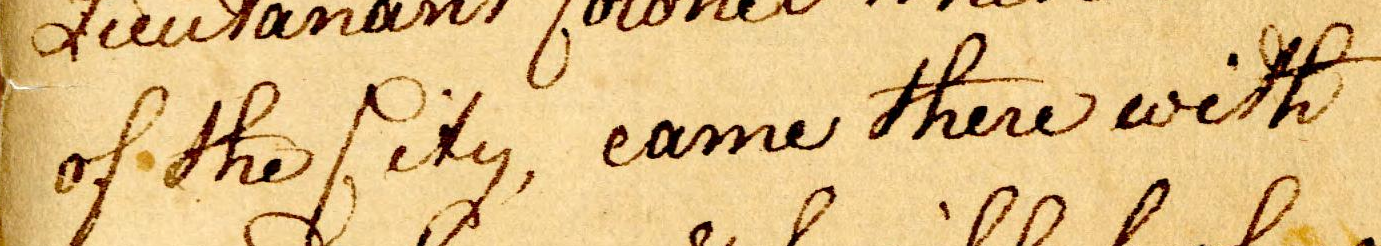of the City, came there with
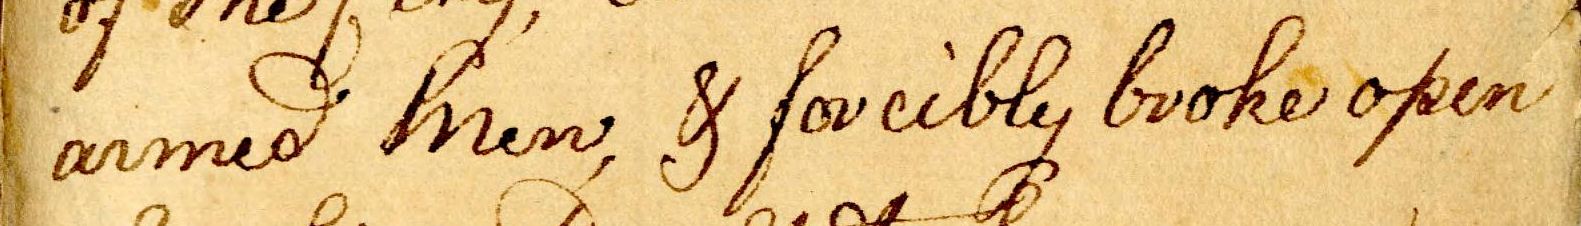armed Men, & forcibly broke open
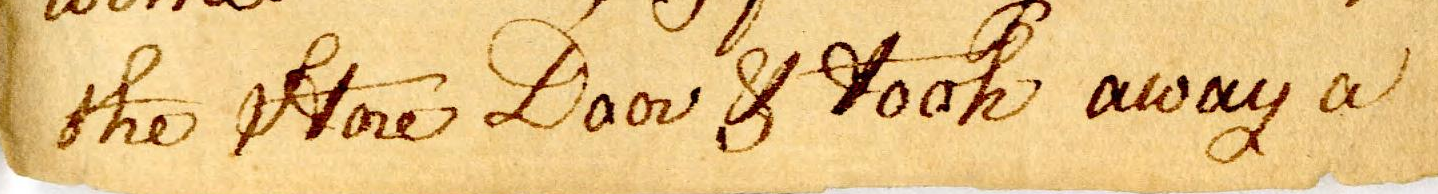the Store Door & took away a
